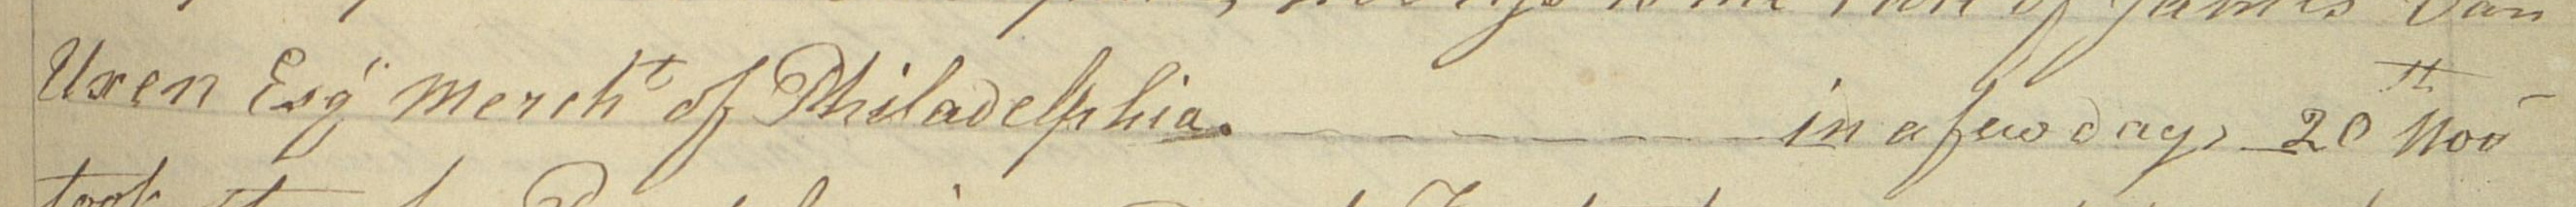Uxen Esq^r Merch^t of Philadelphia. in a few day, 20^th Nov^r
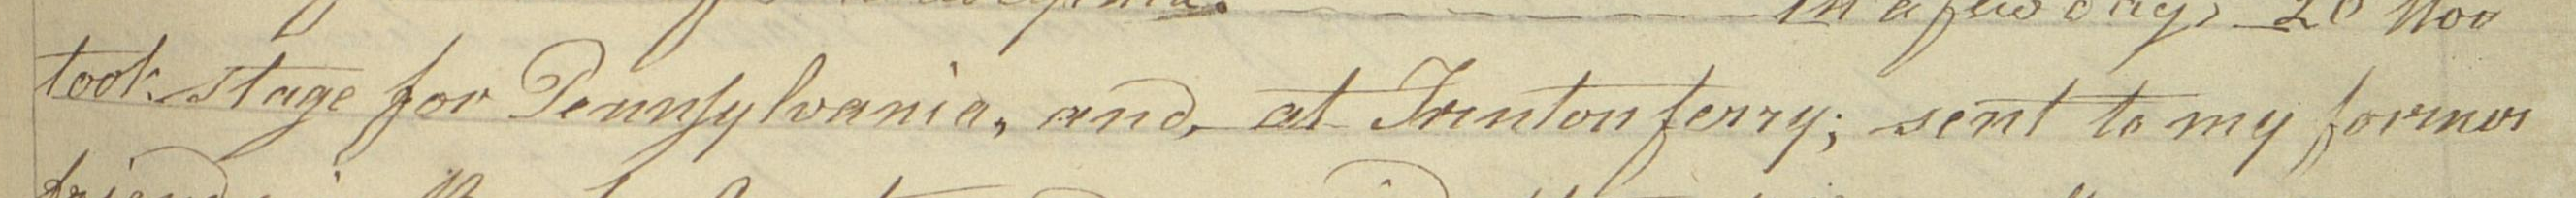took stage for Pennsylvania, and at Trenton ferry; sent to my former
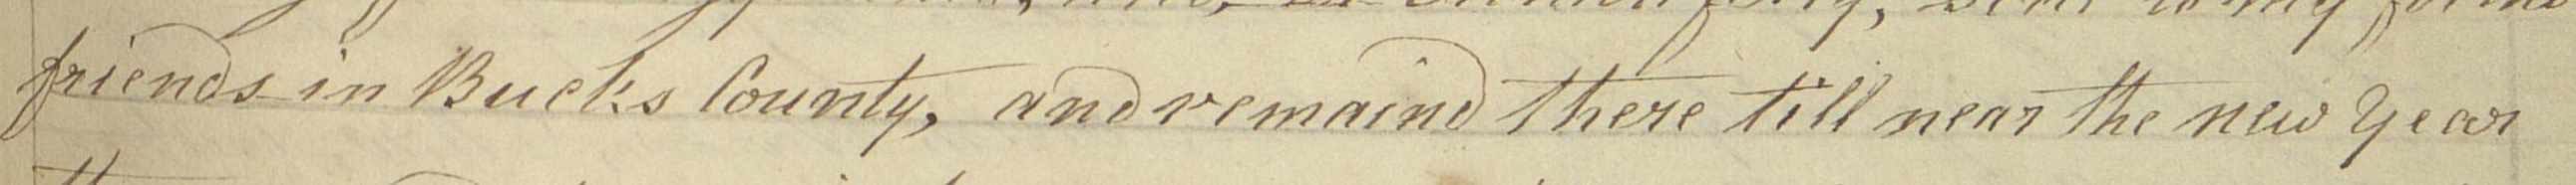friends in Bucks County, and remaind there till near the new year
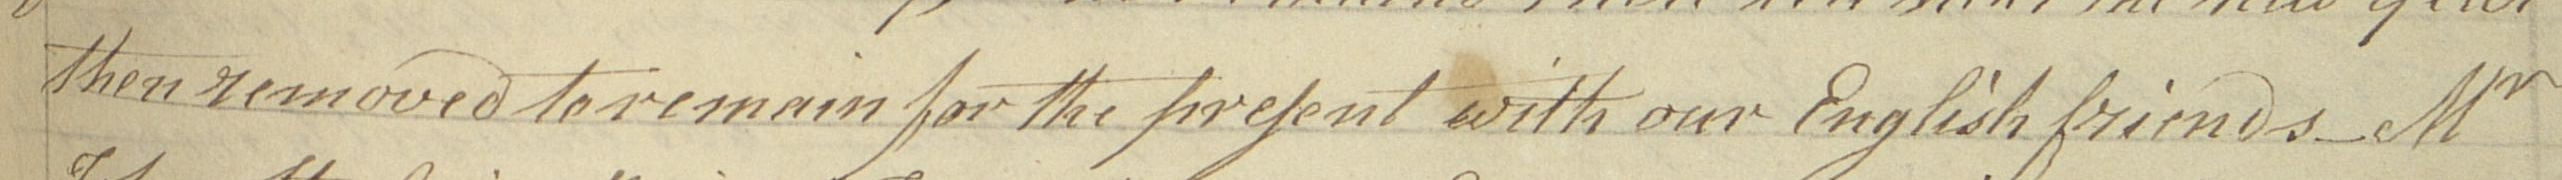then removed to remain for the present with our English friends. M^r
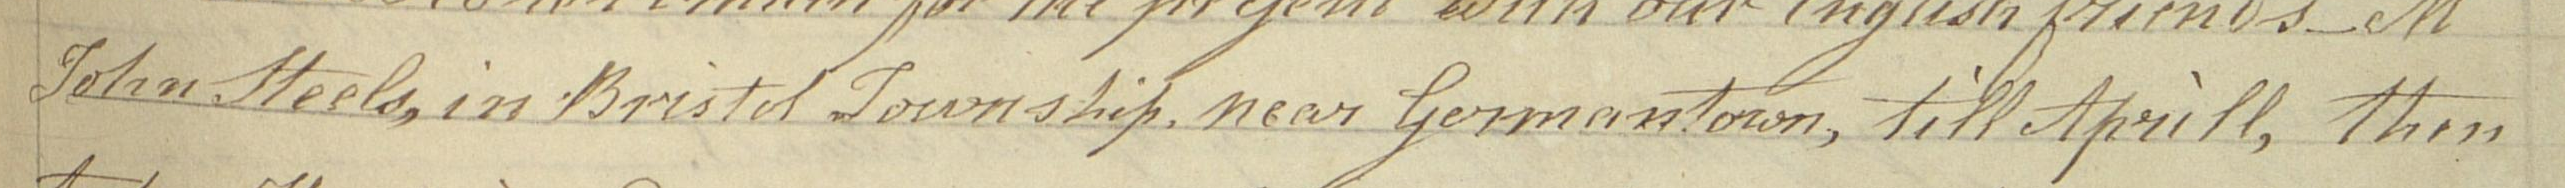John Steels, in Bristol Township. near Germantown, til Aprill, then
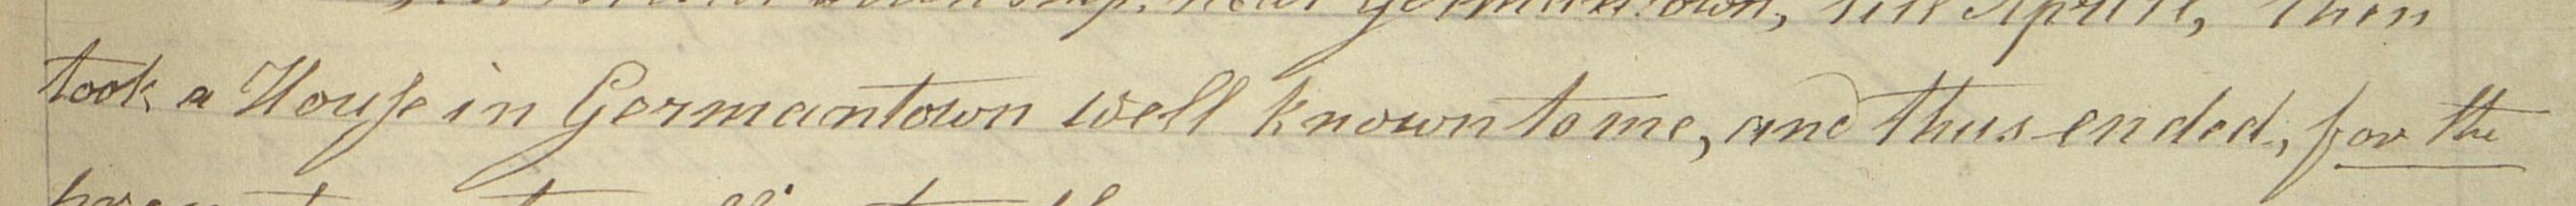took a House in Germantown well known to me, and thus ended, for the
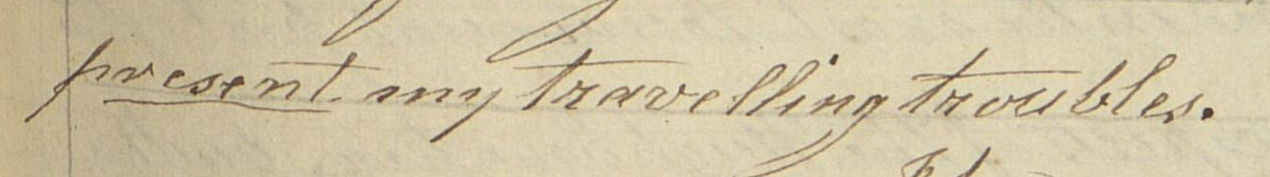present my travelling troubles.
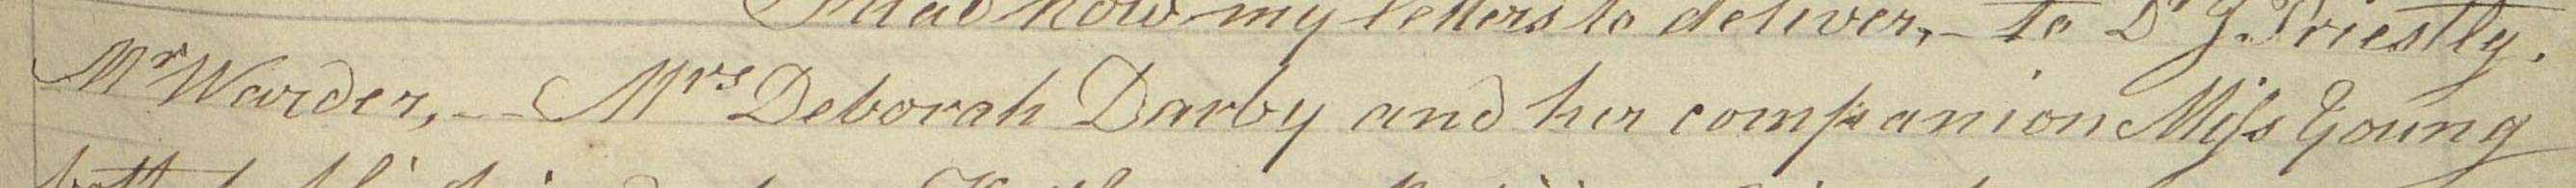M^r. Warder, M^rs. Deborah Darby and her companion Miss Young
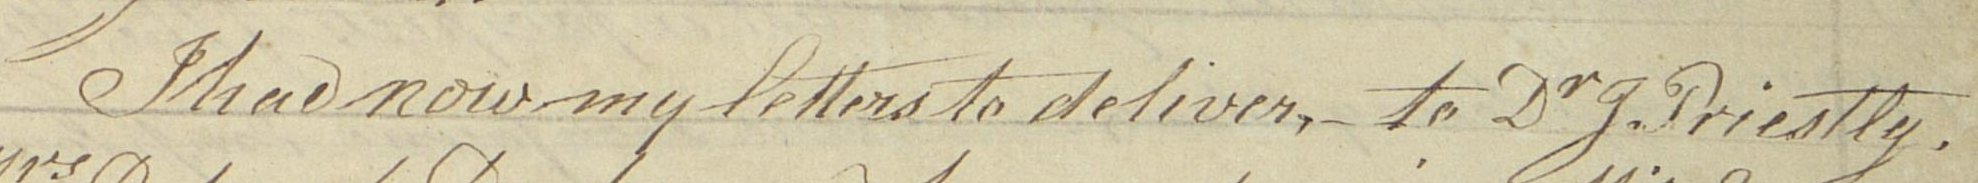I had now my letters to deliver, to D^r J. Priestly,
